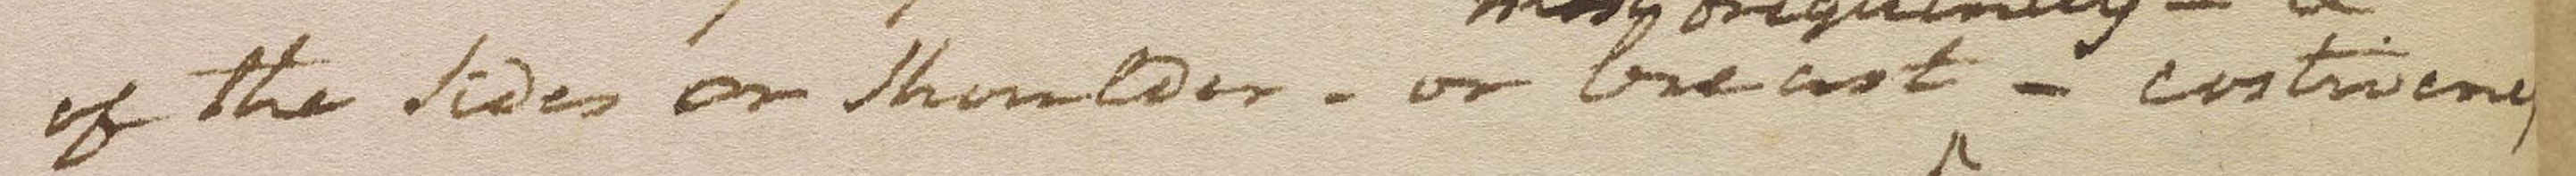of the sides or shoulder- or breast- costinene
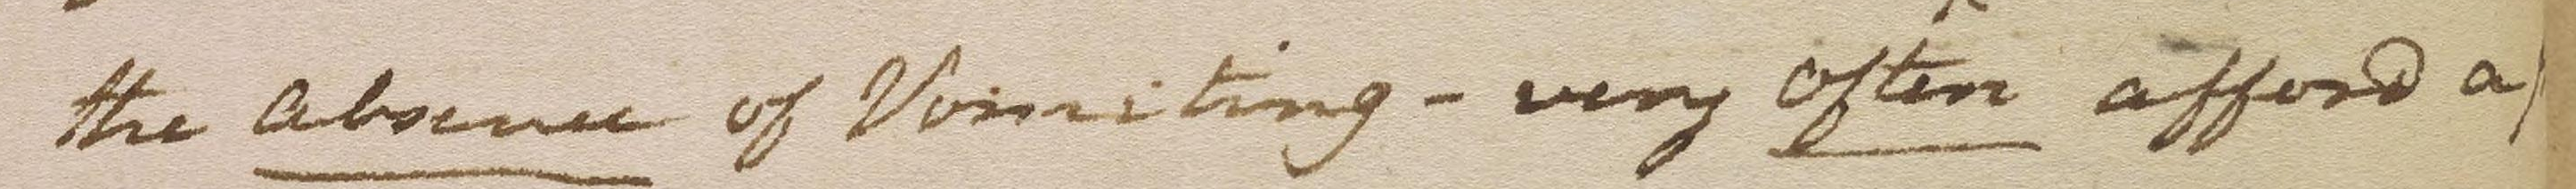the absence of Vomiting- very often afford a
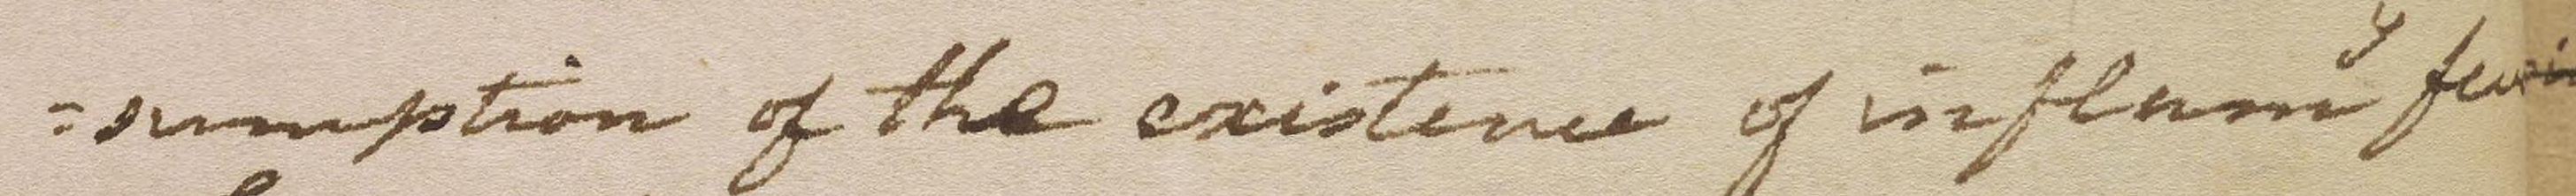-sumption of the existence of inflam^y fev
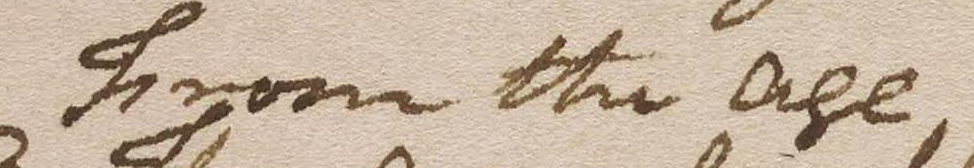From the age
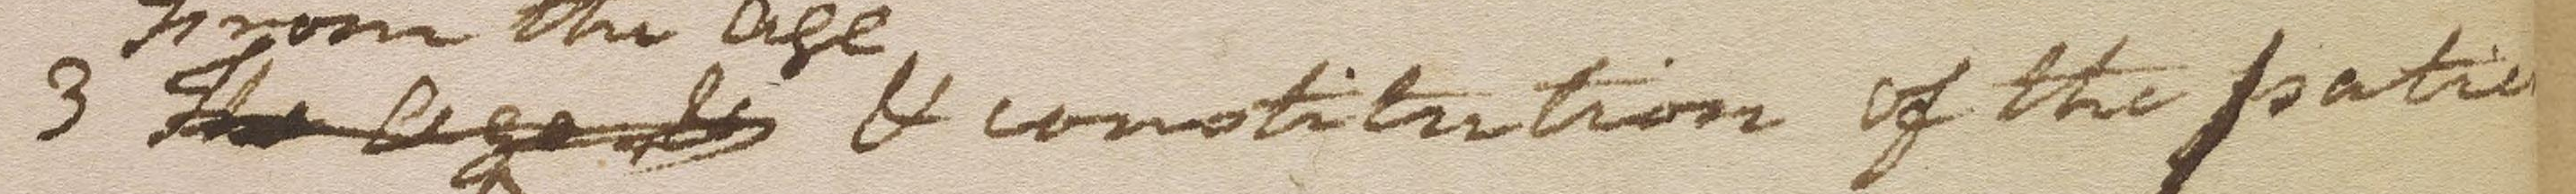3 [The Age &] & & constitution of the particu
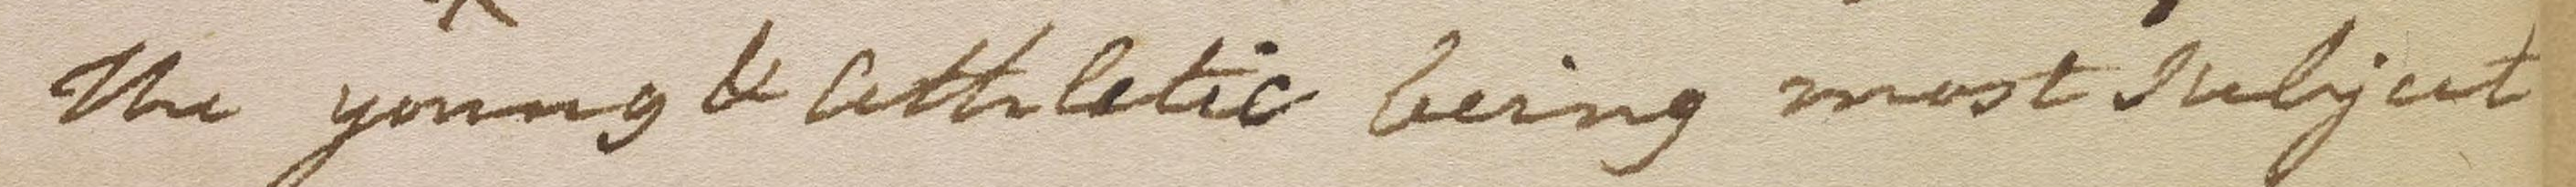The young & athletic eing most subject
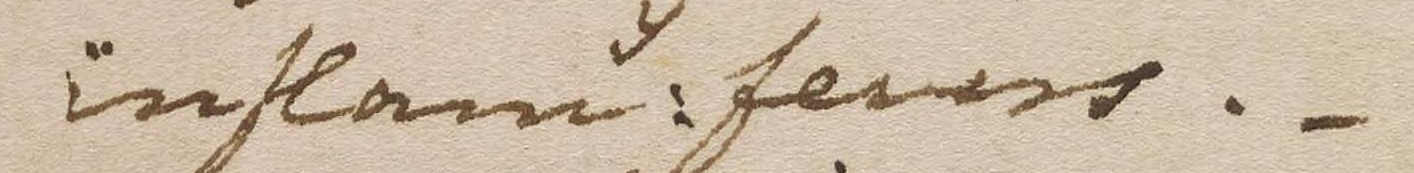inflam^y fevers.-
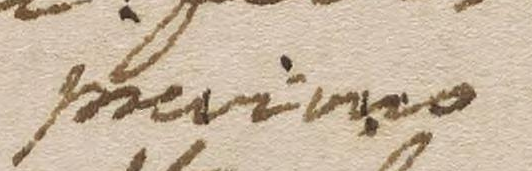previous
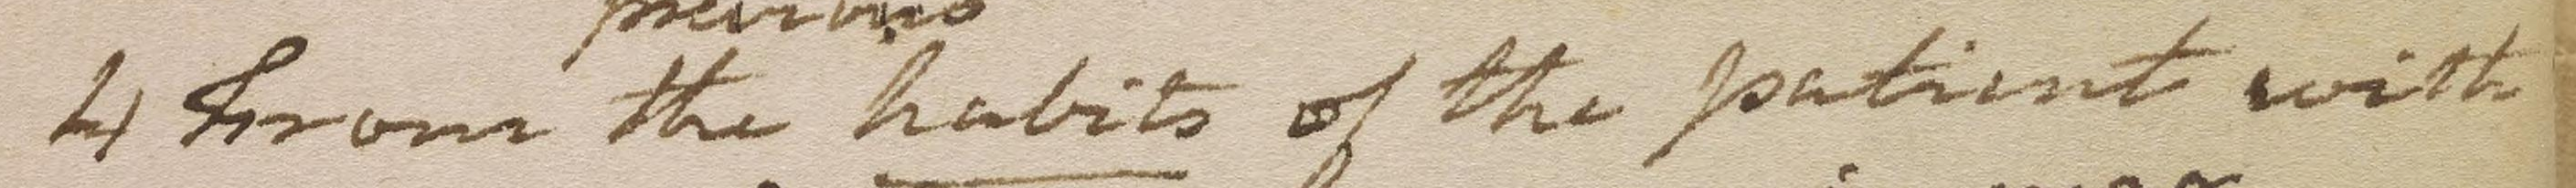4 From the ^ habits of the patient with
